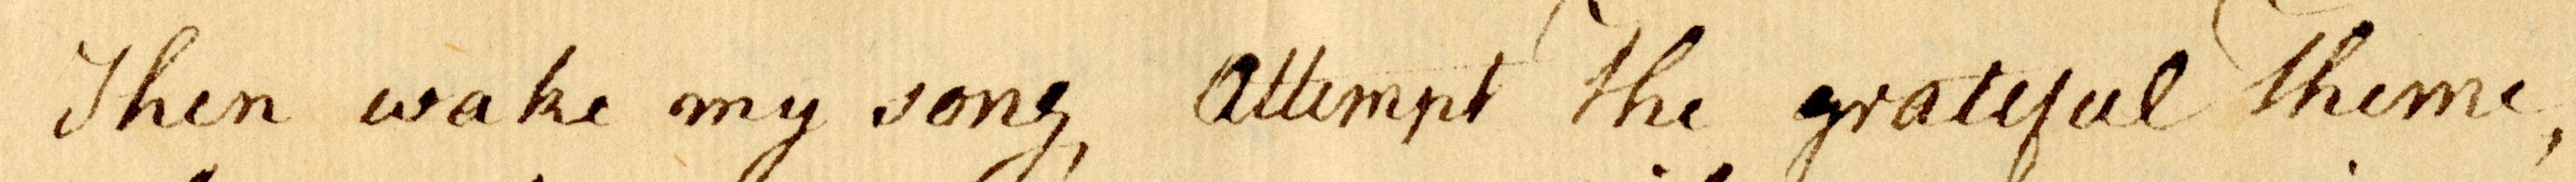Then wake my song, Attempt the grateful theme,
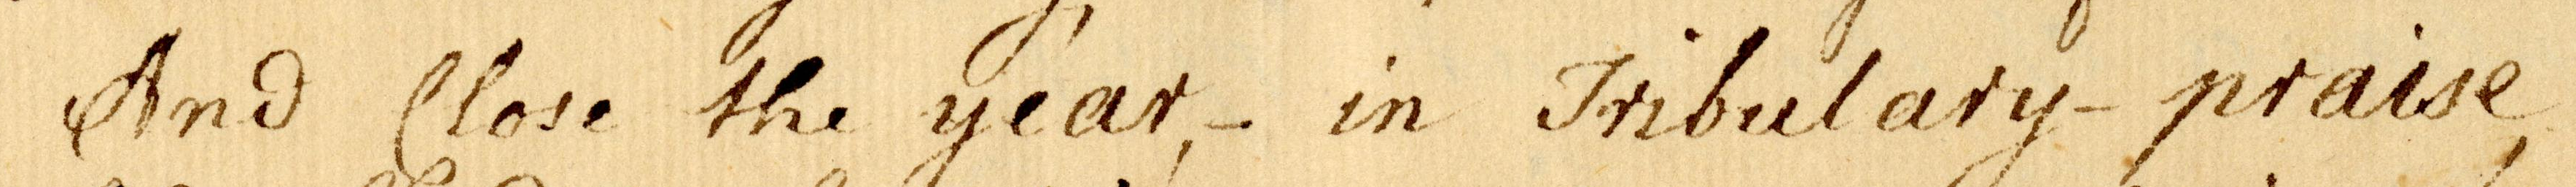And Close the year- in Tributary- praise,
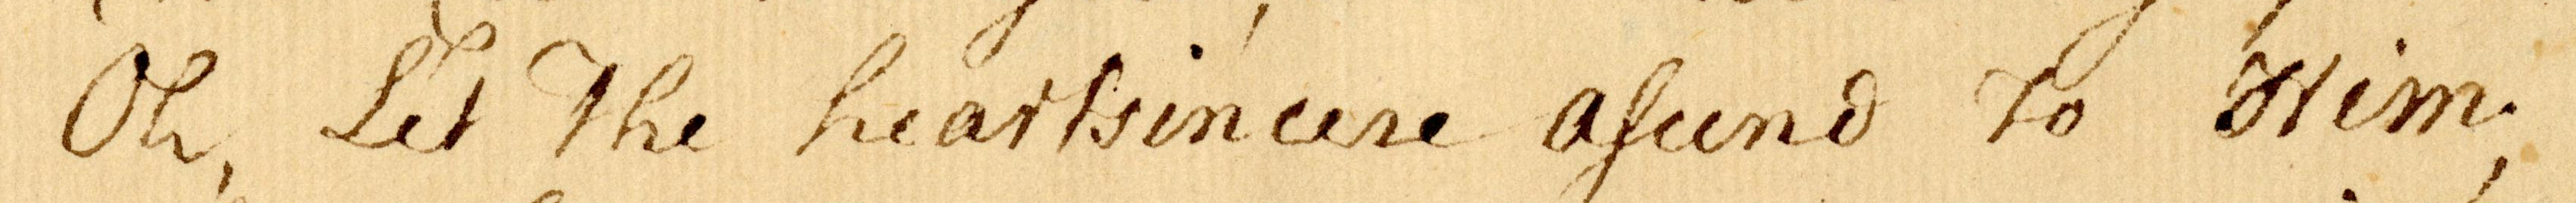Oh, Let the heartsincere ascend to Him
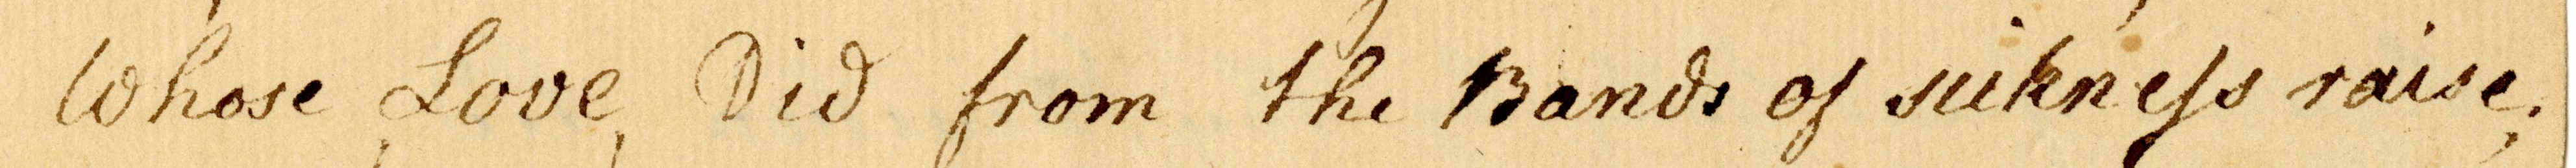Whose Love, Did from the Bands of sickness raise;
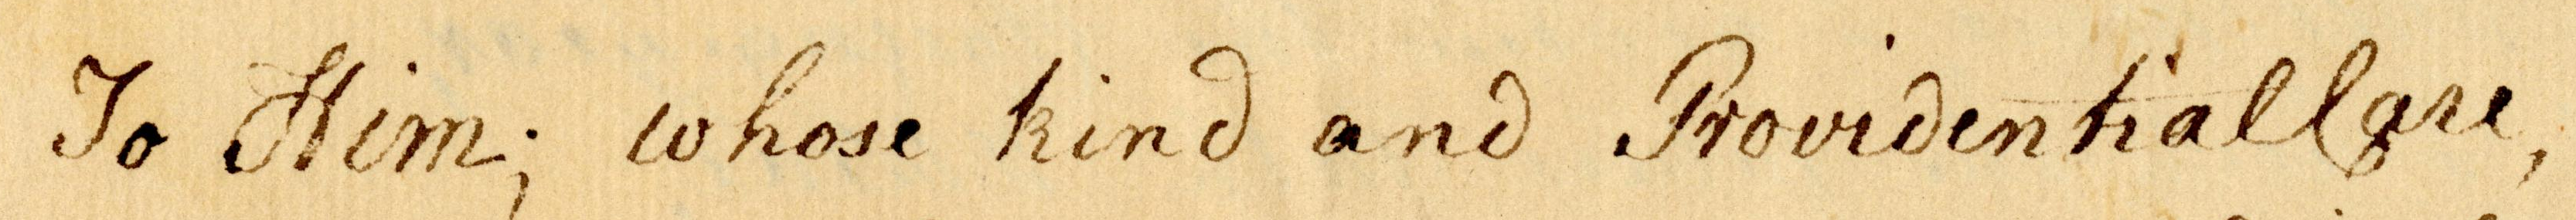To Him; whose kind and Providential Care,
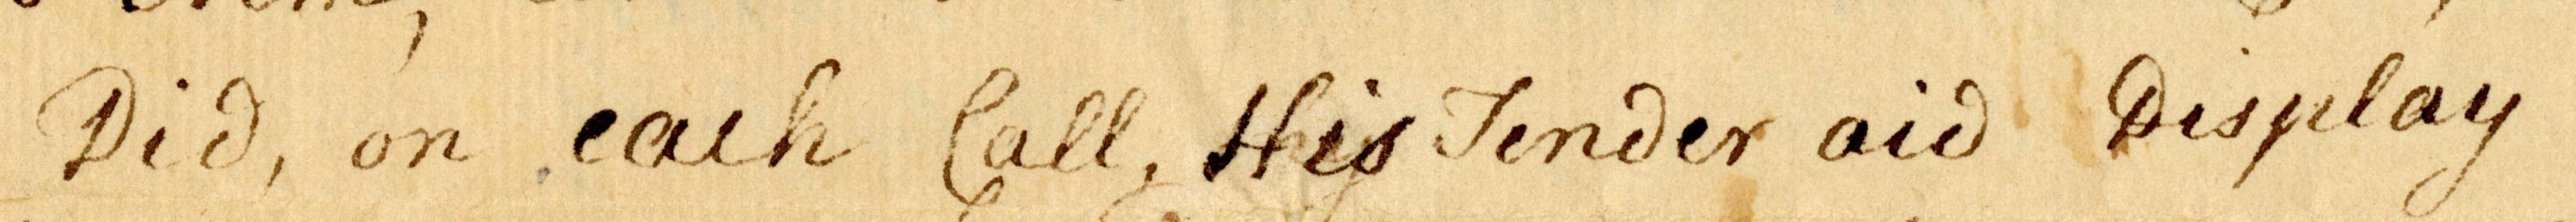Did, on each Call, His Tender aid Display
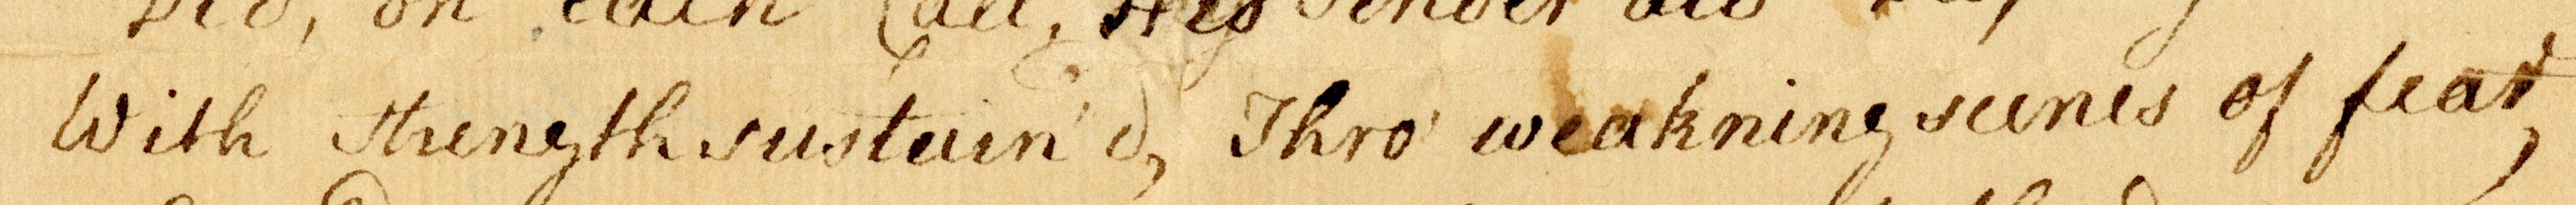With strength sustain'd, Thro' weakning scenes of fear,
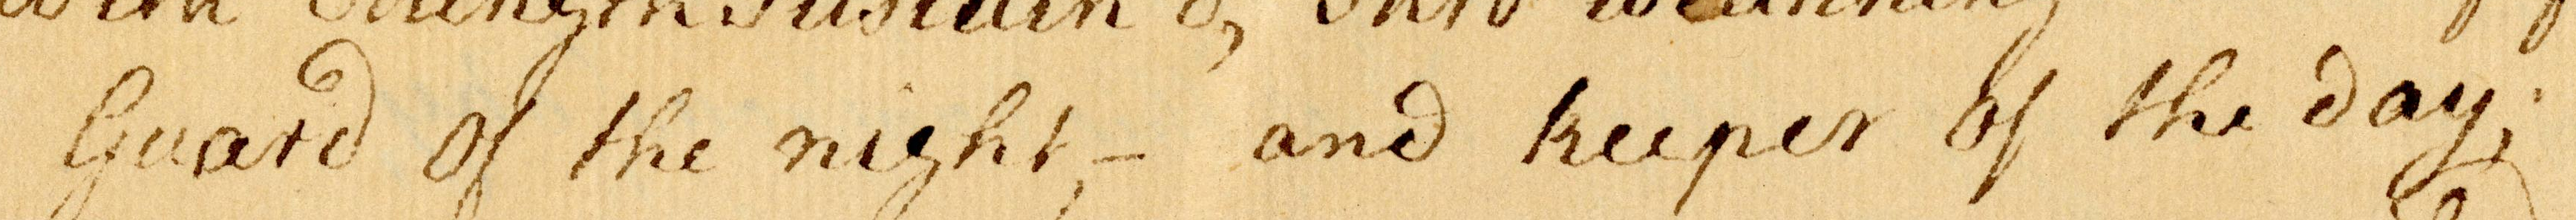Guard of the night- and keeper of the day;
